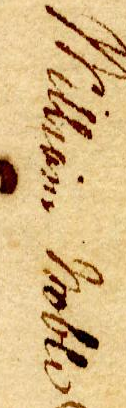William Noble
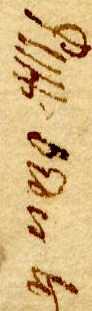Pllll Order to
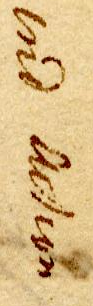end action
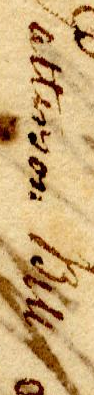Patterson Bill
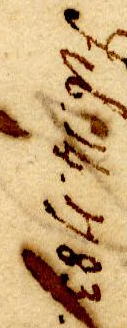Feb. 14. 1783.
